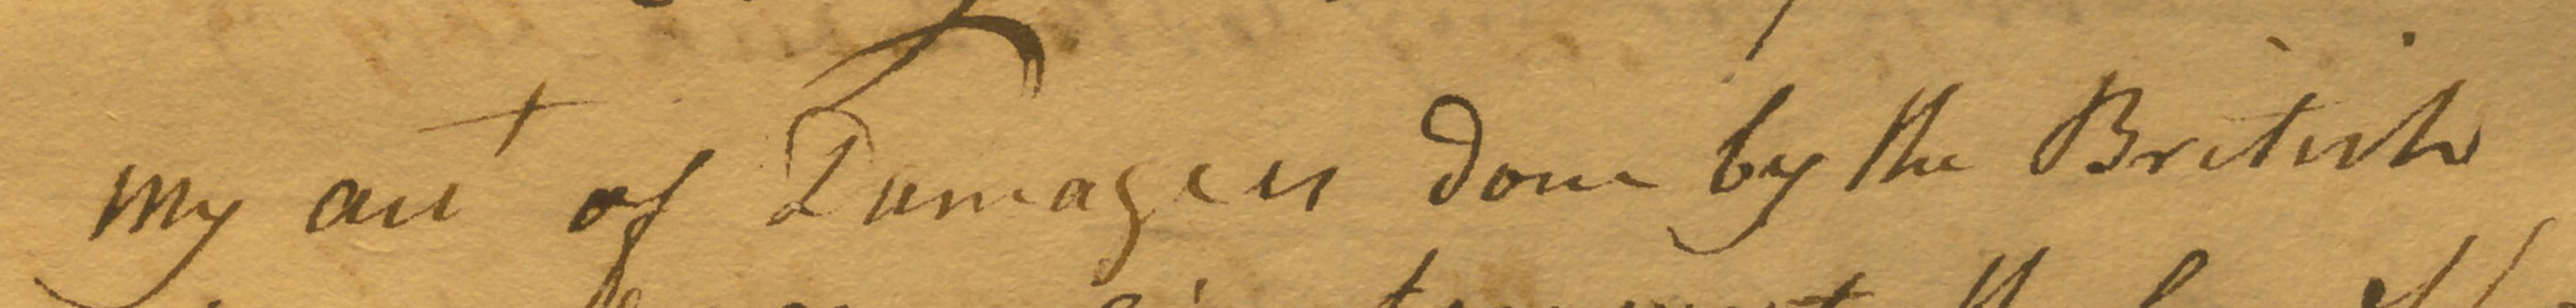my acc^t of Damages done by the British
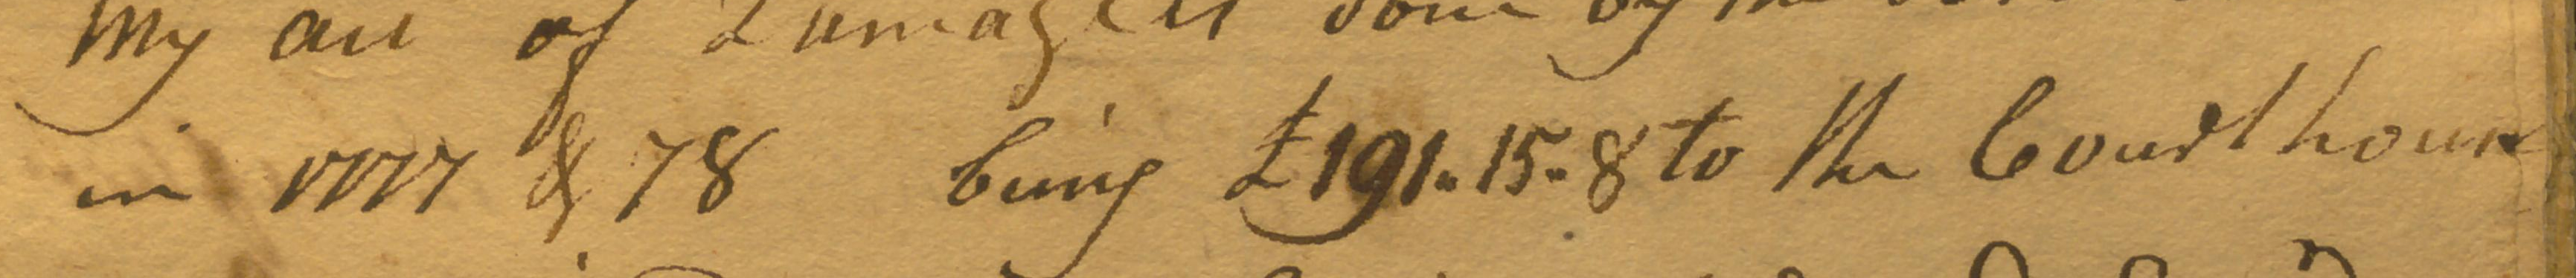in 1777 & 78 being £191.15.8 to the Courthouse
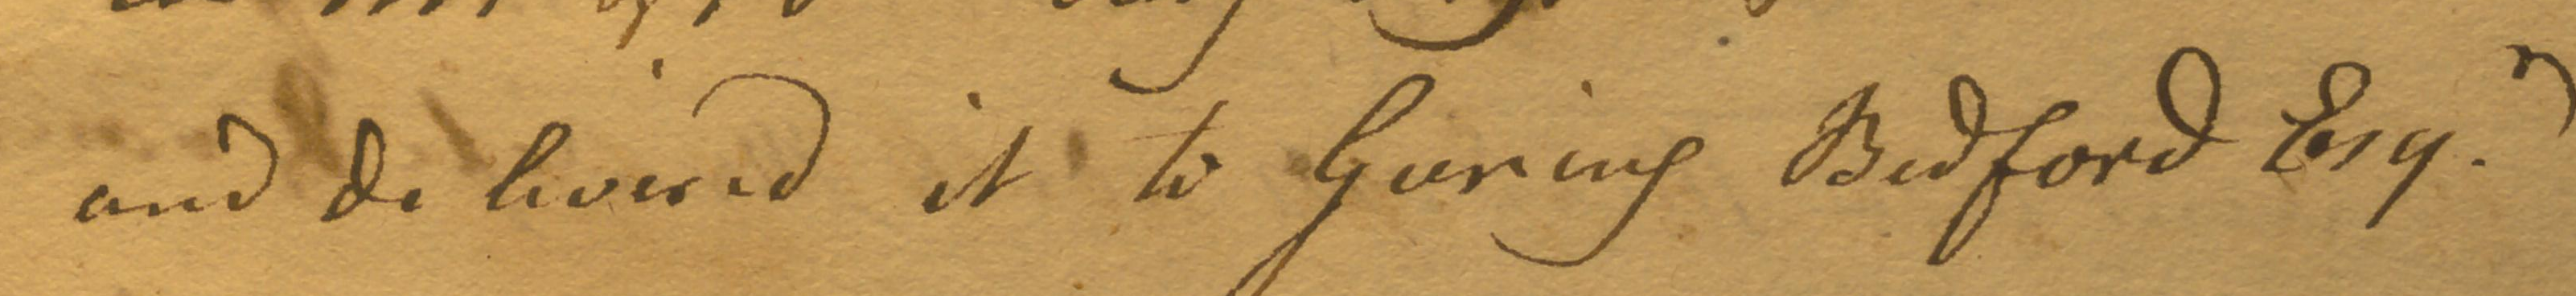and delivered it to Guring Bedford Esq^r.
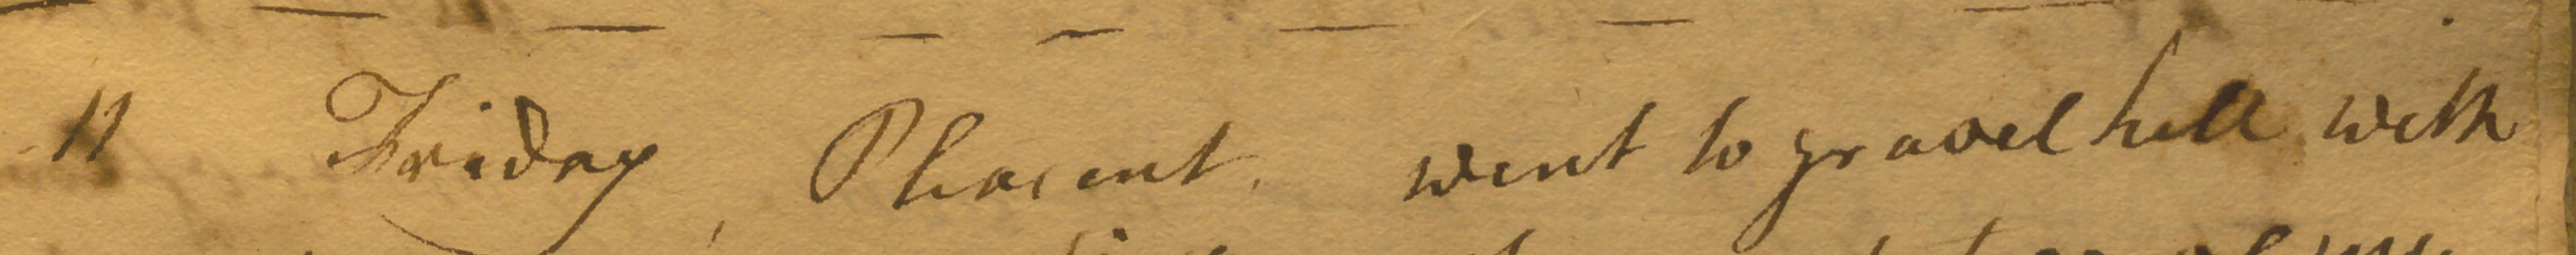11 Friday Pleasent. went to gravel hill with
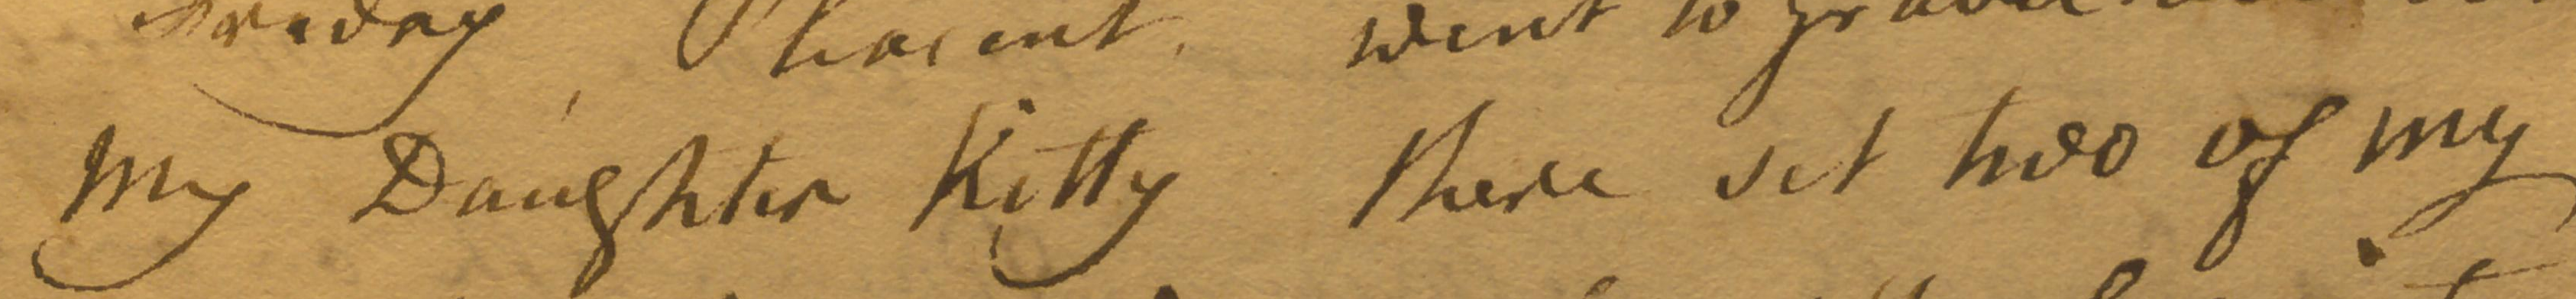my Daughter Kitty there set two of my
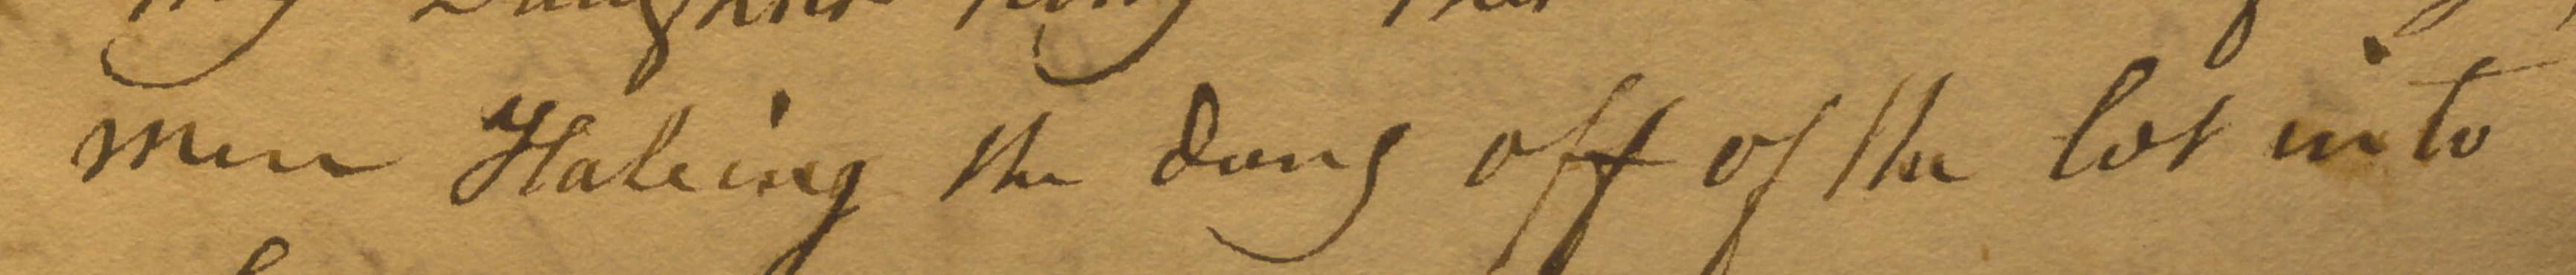men Haleing the dung off of the lot in to
